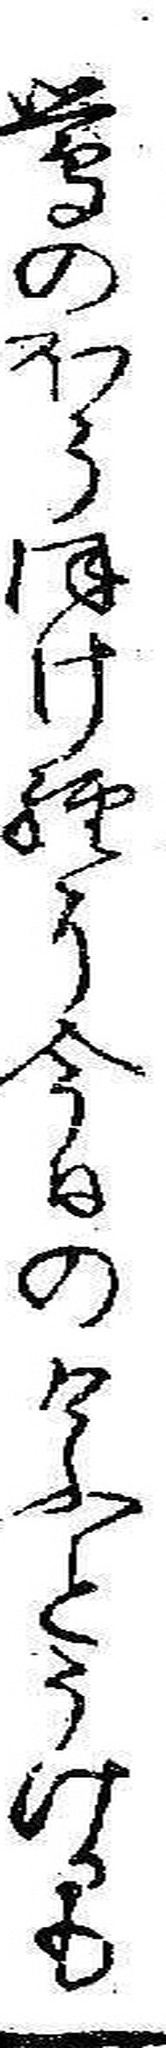鶯のほうほけ経に今日のけふとかけるも
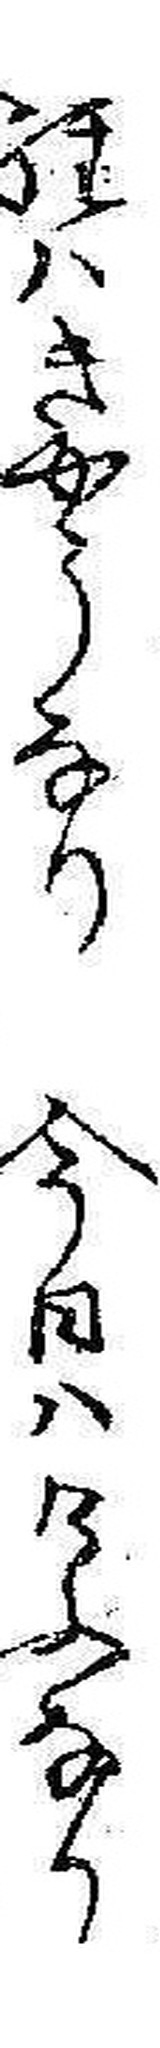経はきやうなり今日はけふなり
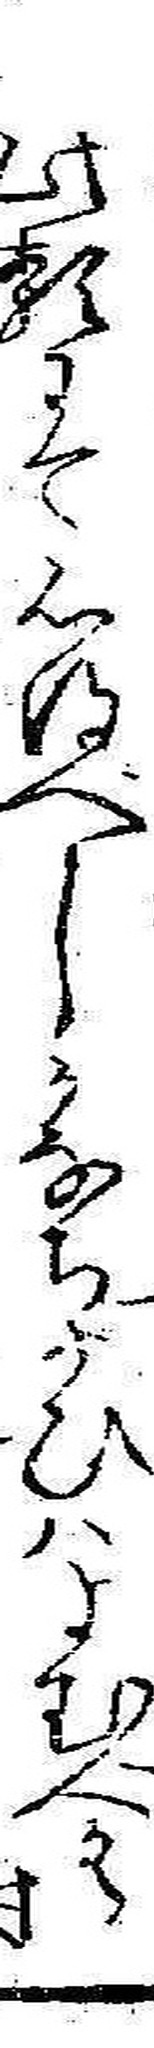此類にて心得べしかなちかひはよむべからす
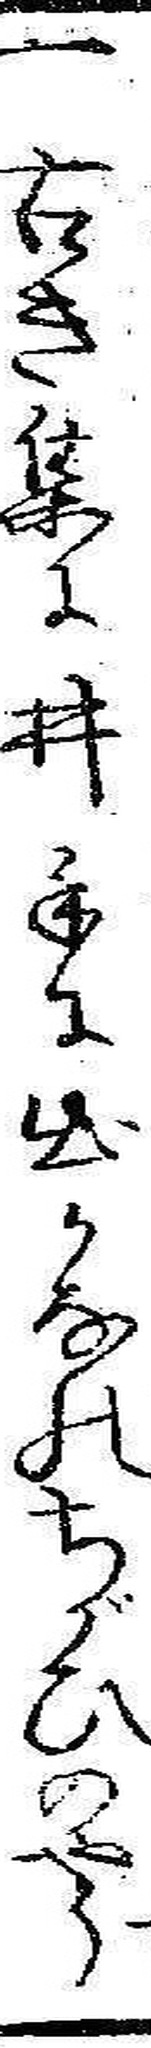一古き集に井手に出かなのちがひのやう
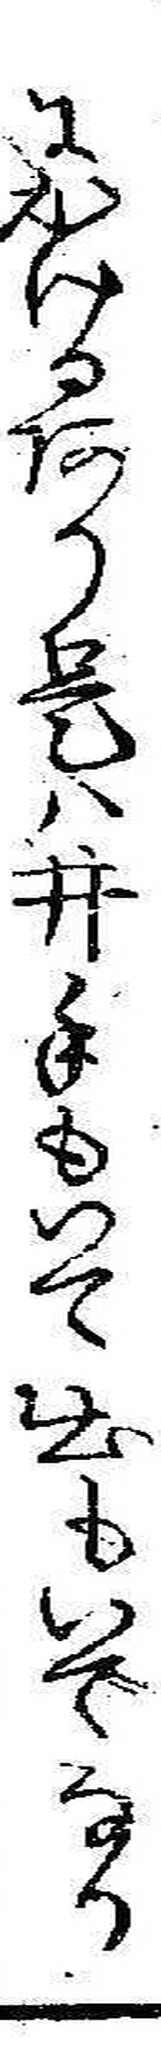にかけるあり是は井手もいて出もいでなり

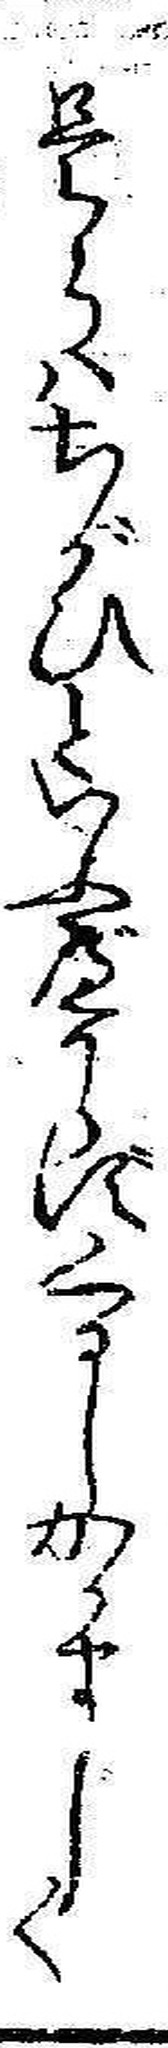是かはちがひといふべからずくわしかまじく
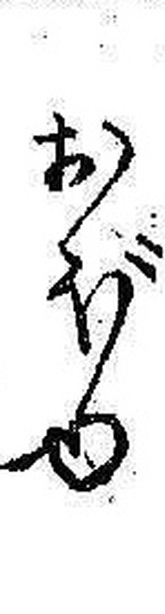おぼゆ
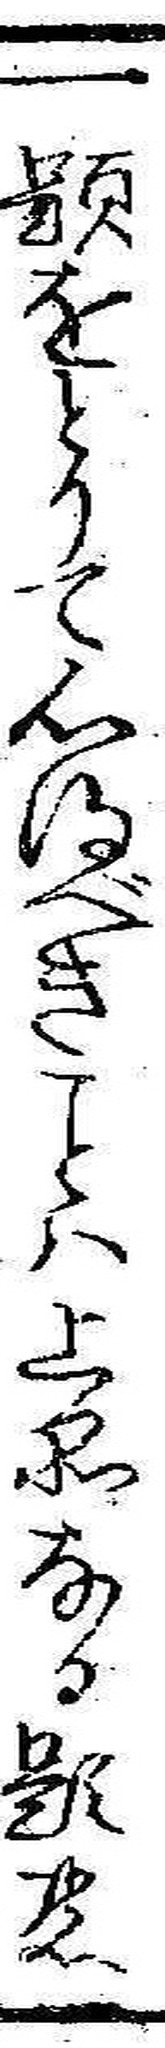一題をとりて心得べきことは上品なる題の
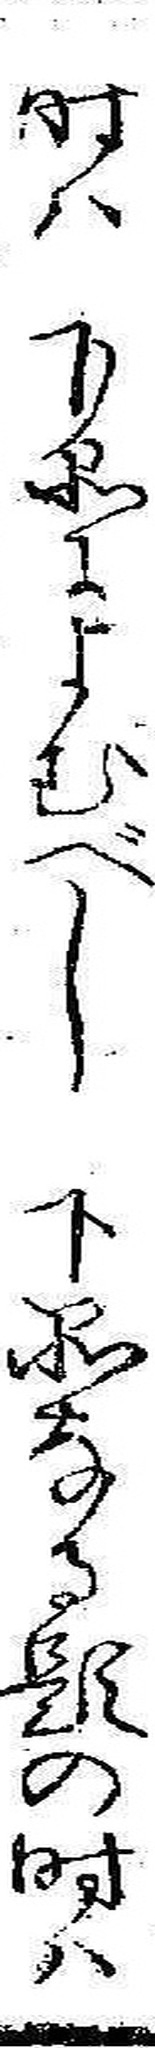時は下品によむべし下品なる題の時は
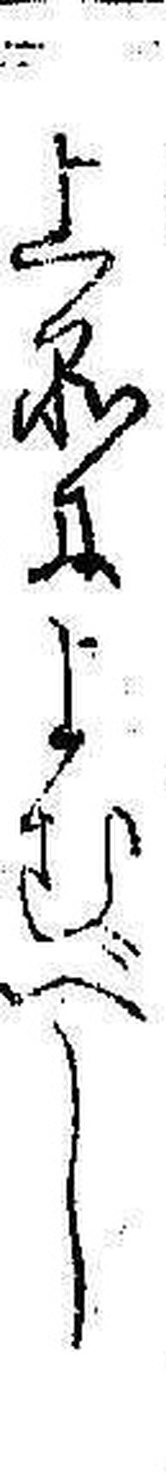上品によむべし
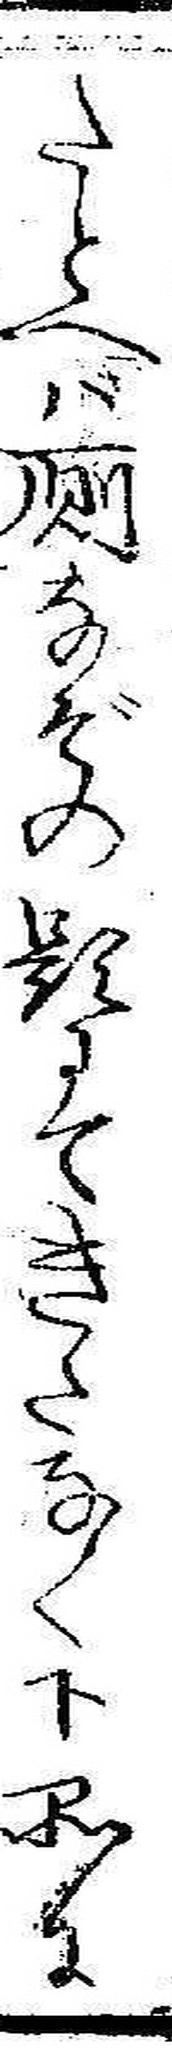たとへば厠なぞの題にてきたなく下品に
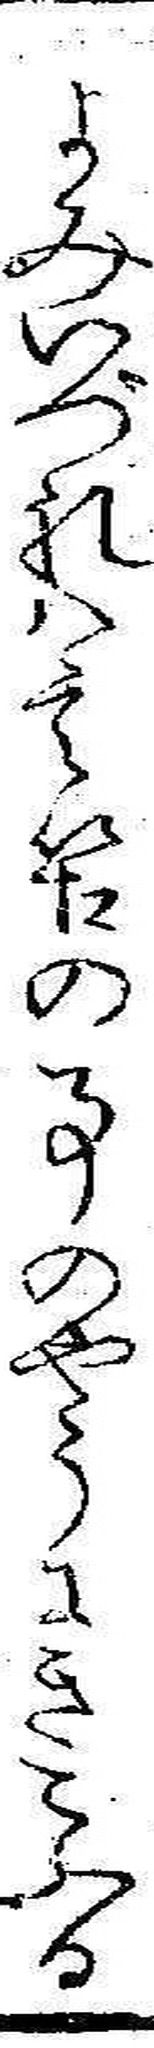よみいづれはの事のやうにきこふる
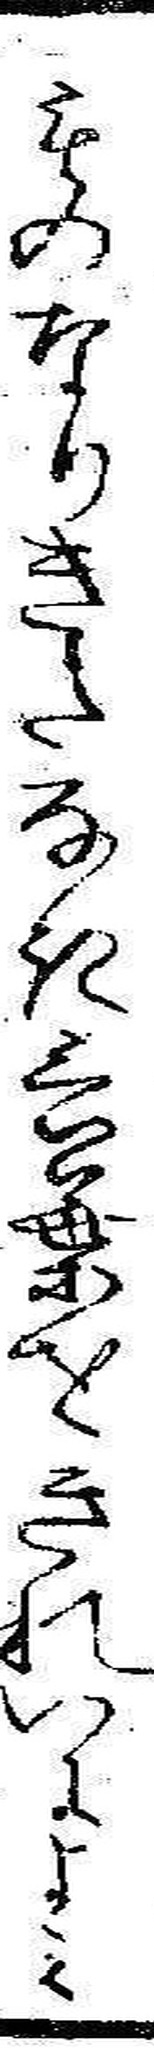ものなりきたなき言葉をきれいよみ
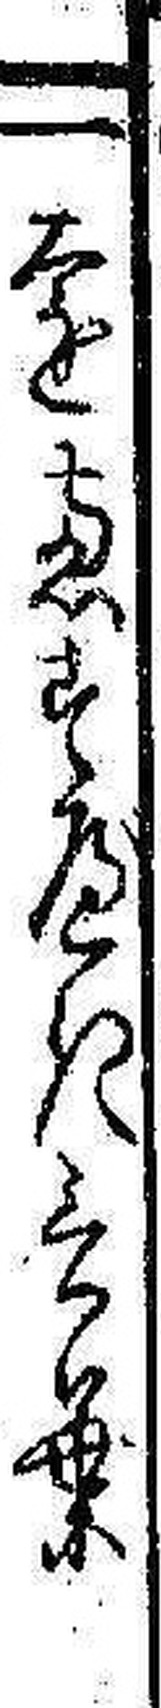一遠慮すべき言葉
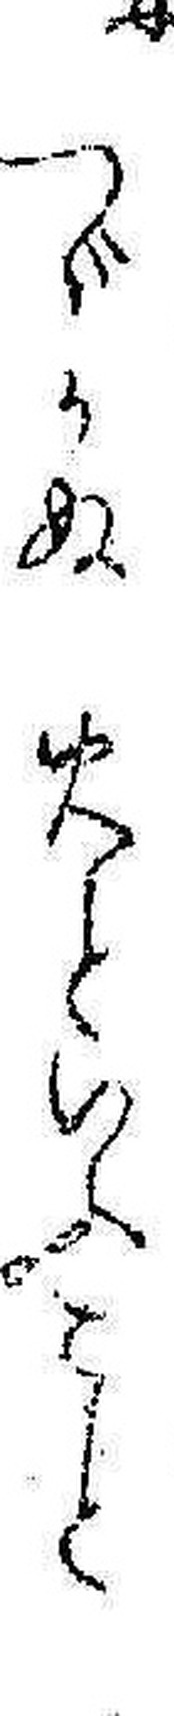つゞかぬ火といふこと
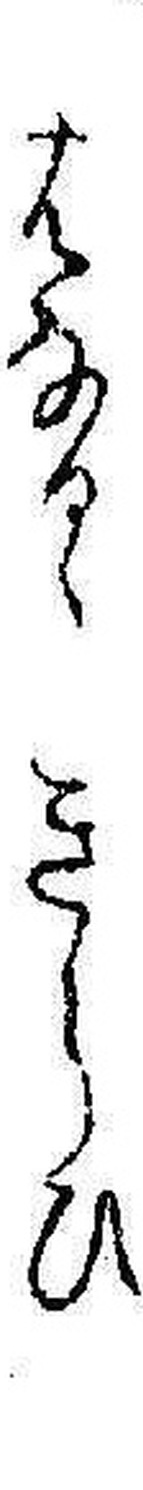はなるゝきらひ
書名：狂哥はまのきさご
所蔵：国文学研究資料館
